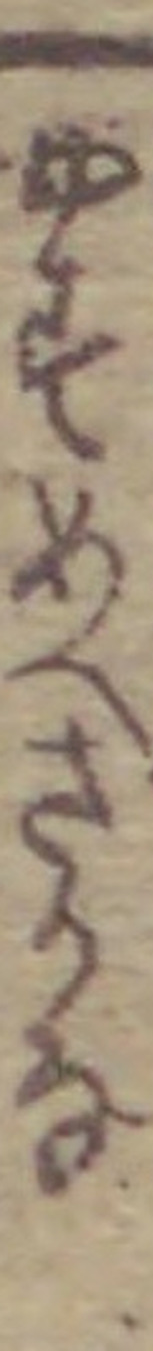やすめへさかな
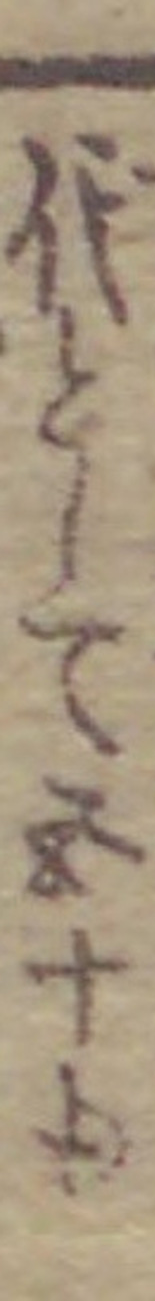代として五十も
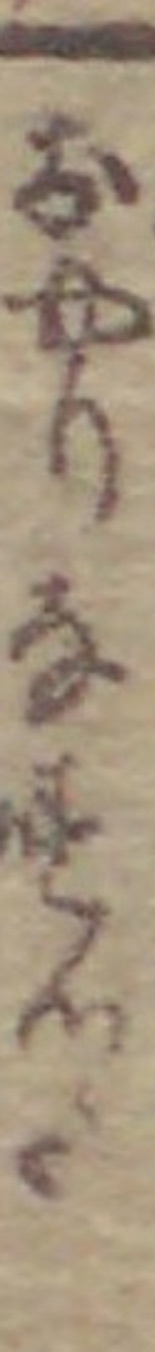おやりなすつた

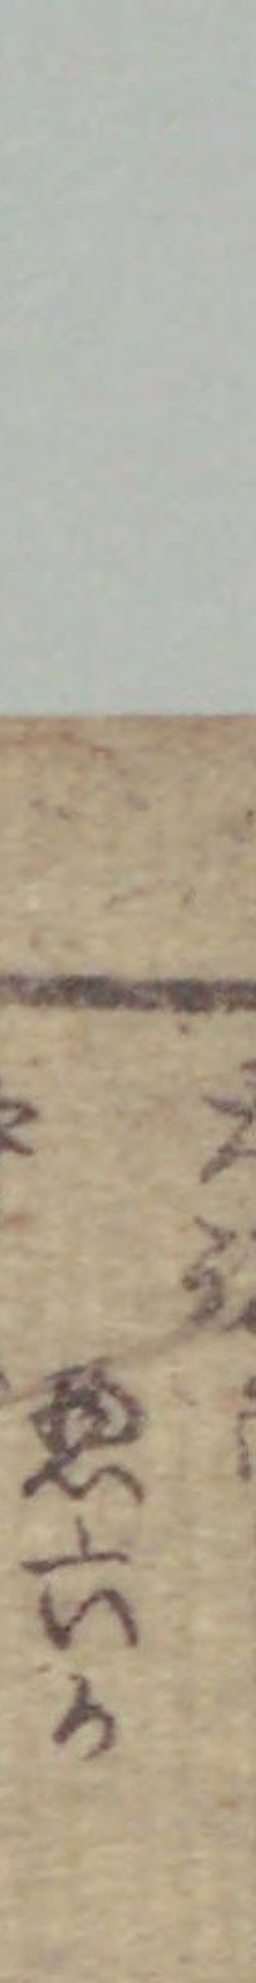惣六か
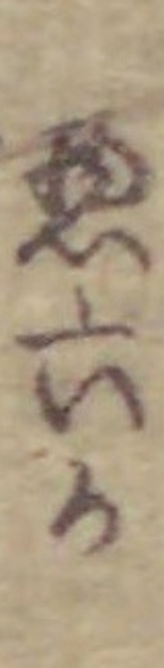惣六か
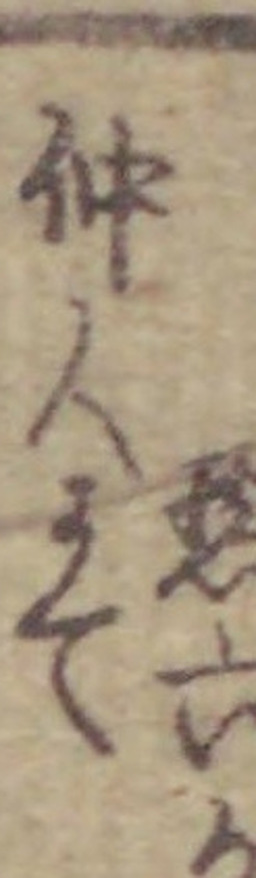仲人にて
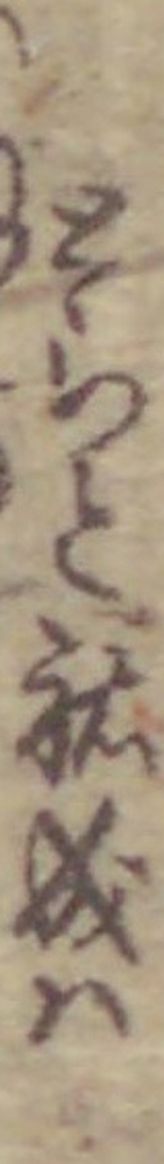とらと祐成は
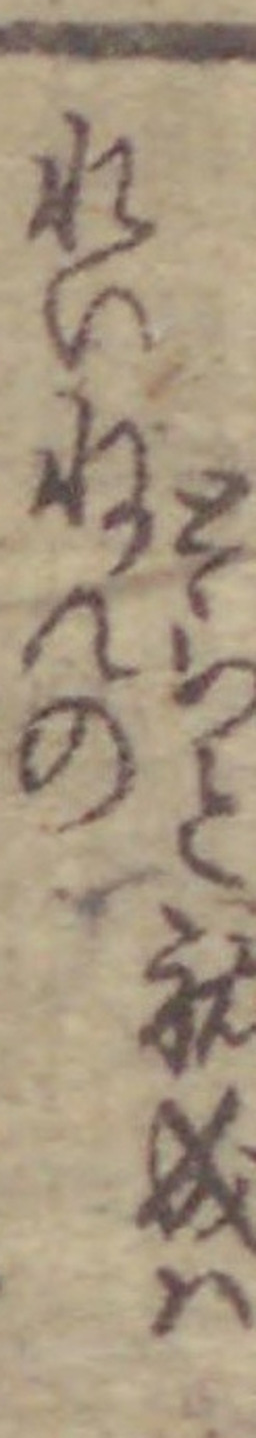れいねんの
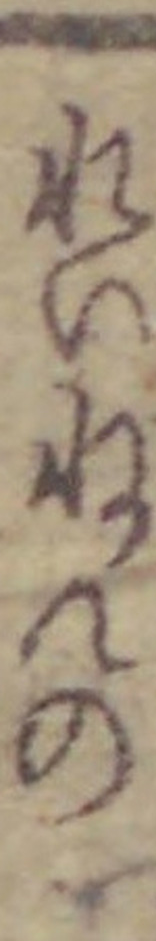れいねんの
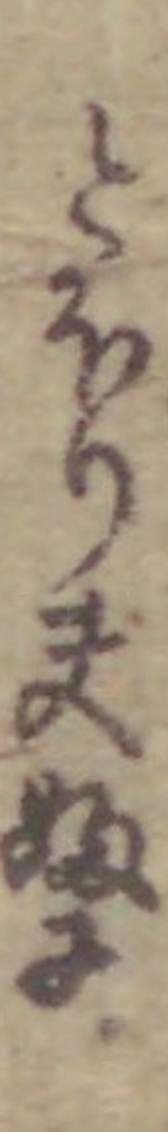とほり夫婦に
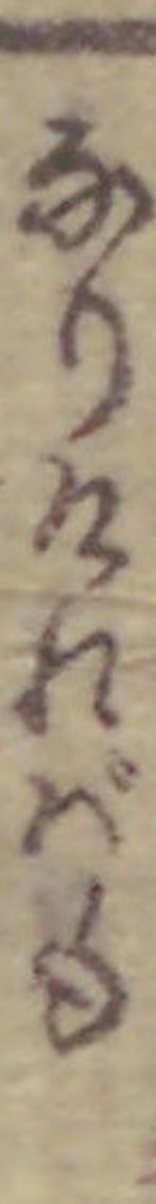なりければも
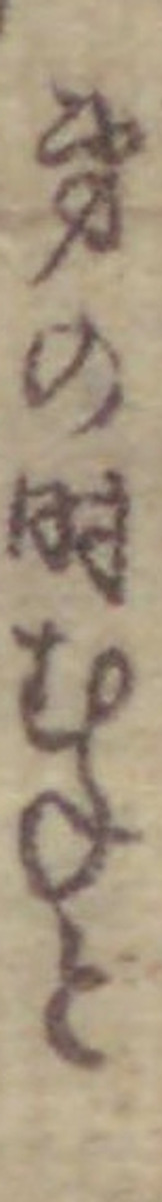弟の時むねと
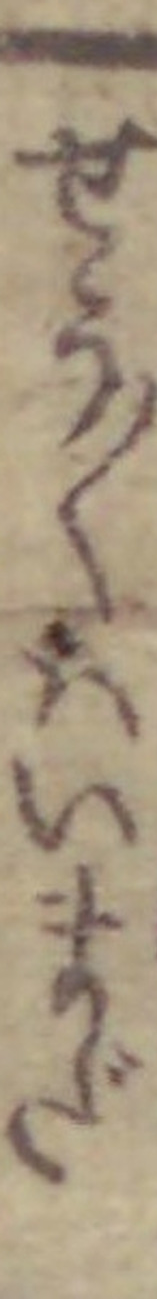せう〳〵はいまだ
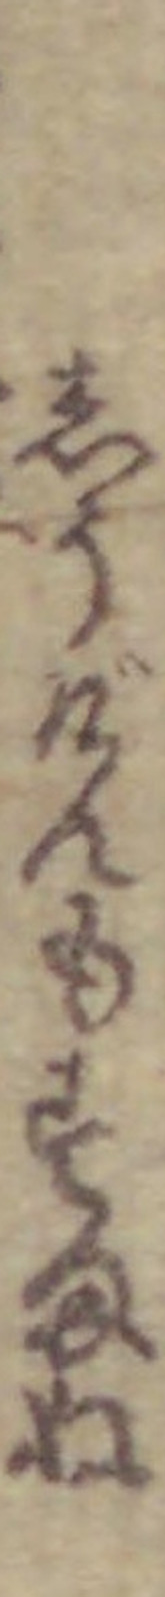しうげんもすまぬ
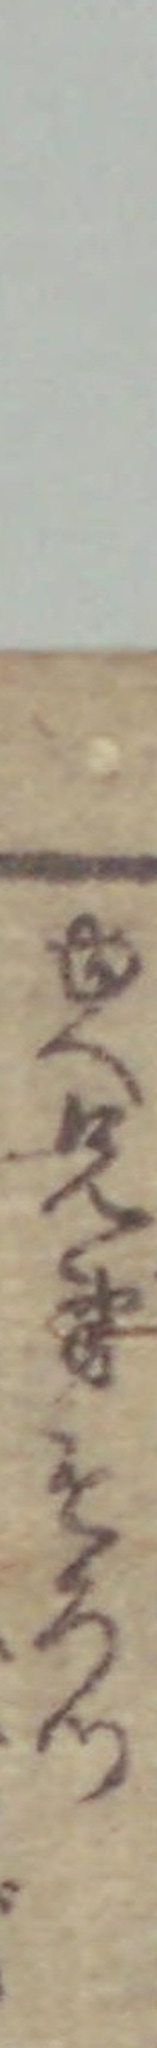ゆへ兄弟そろつ
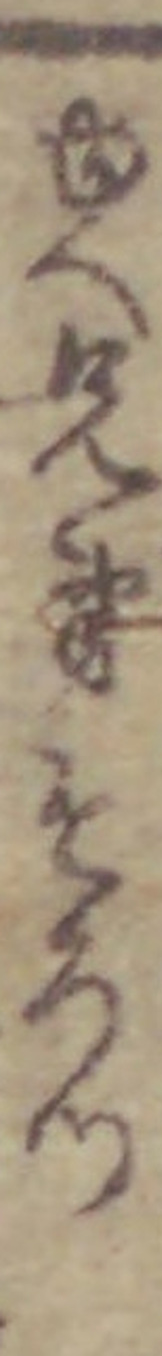ゆへ兄弟そろつ
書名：間似合嘘言曽我 3巻
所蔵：国立国会図書館 National Diet Library, JAPAN
